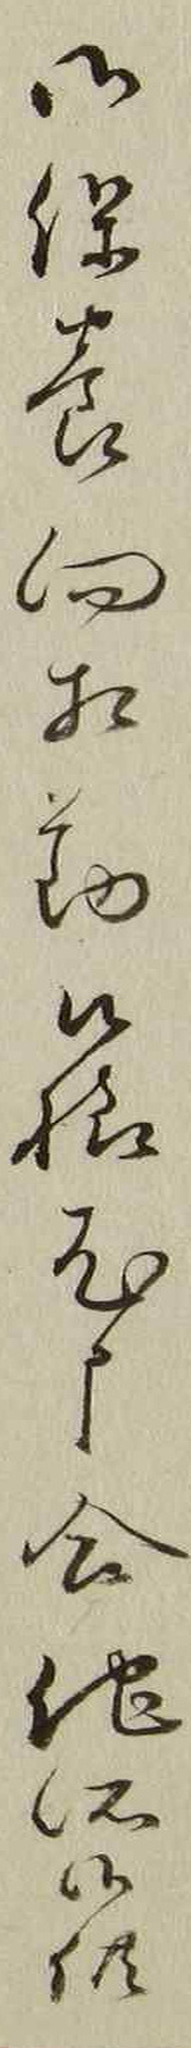御保養向相勤候様尤申合他所御供
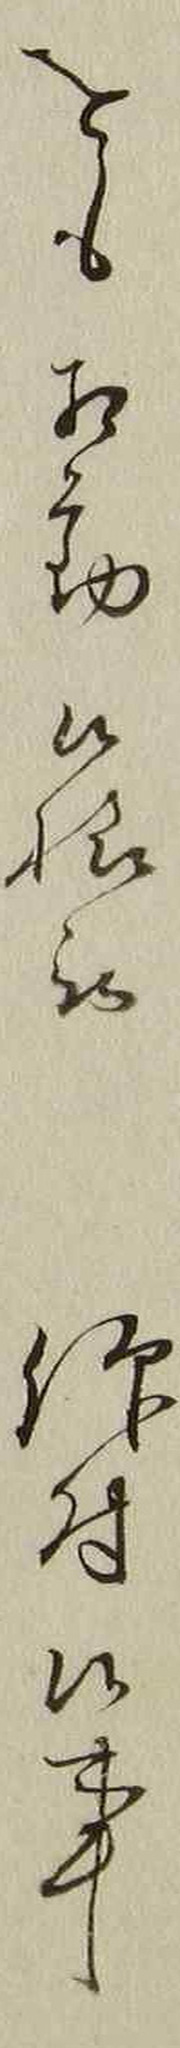をも相勤候様被仰付候事
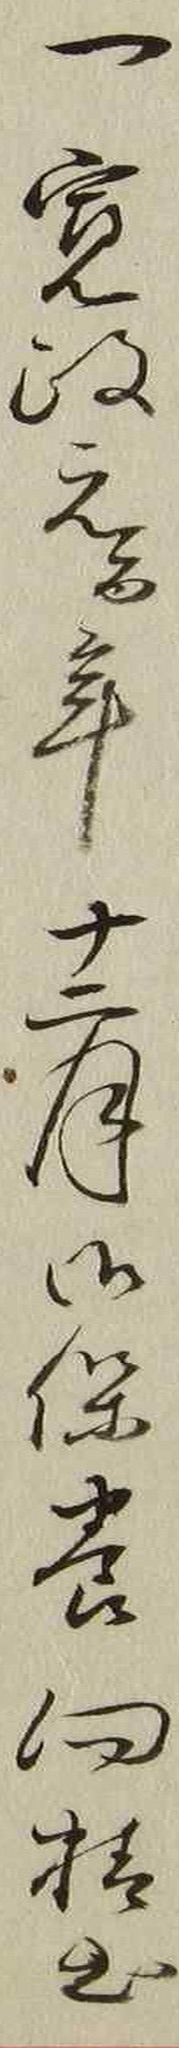一寛政元酉年十二月御保養向精出
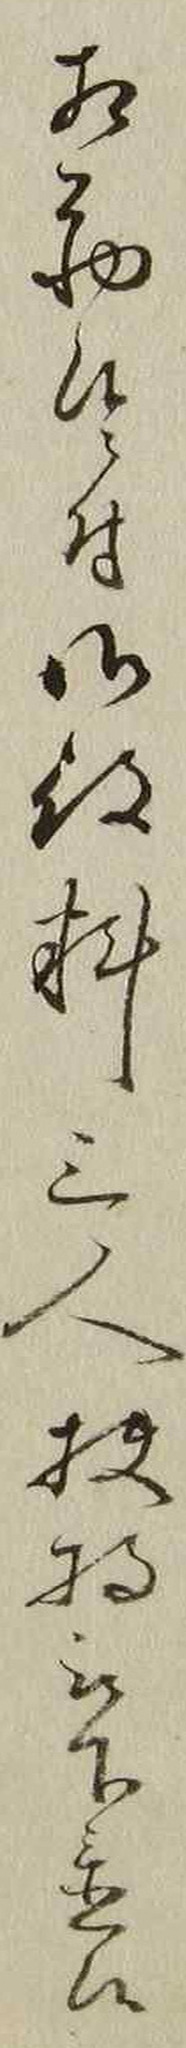相勤候ニ付御役料三人扶持被下置候
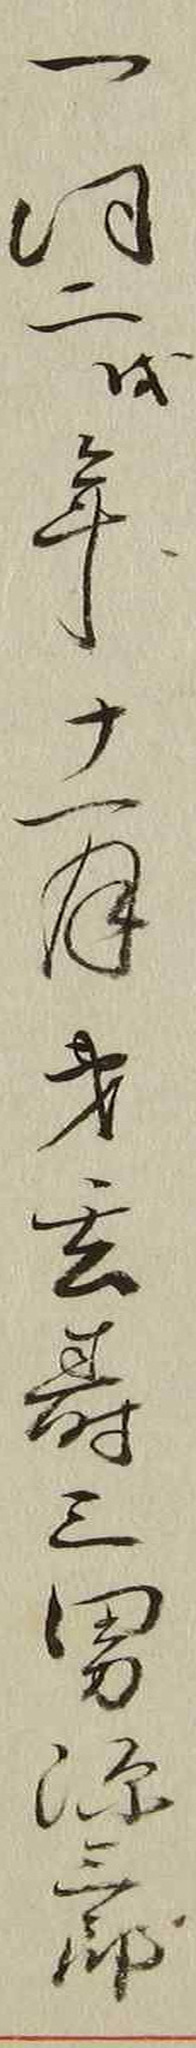一同二戌年十一月弟玄寿三男源三郎
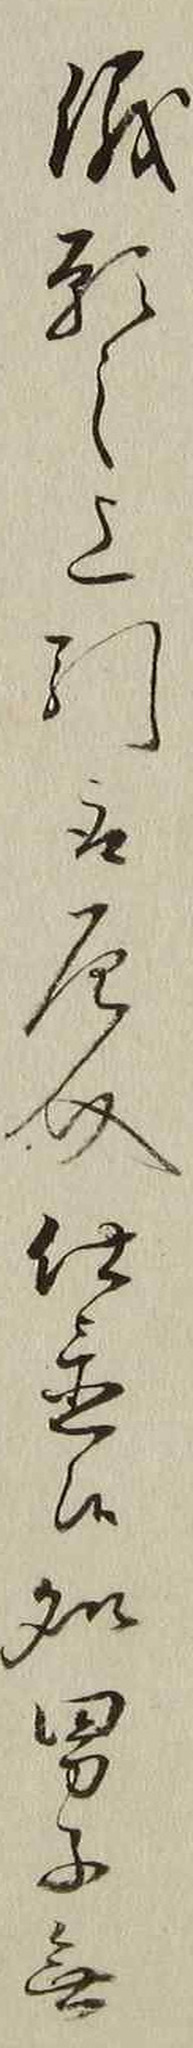願之上引取厄介仕置候処男子無
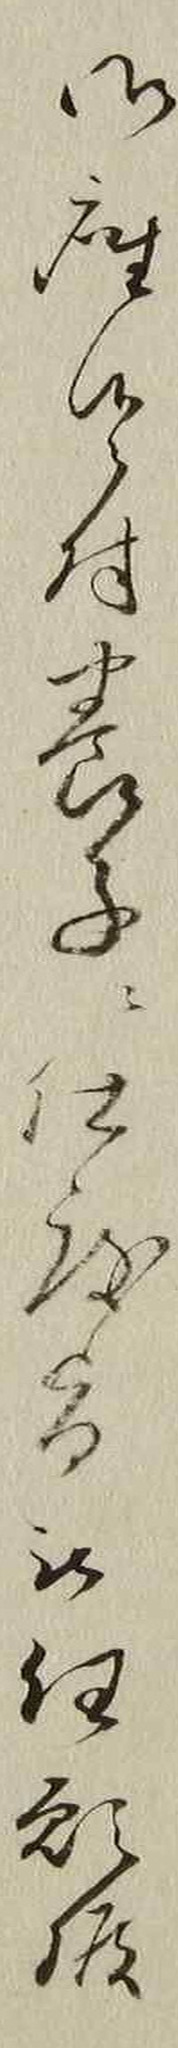御座候ニ付養子仕度旨被任願候
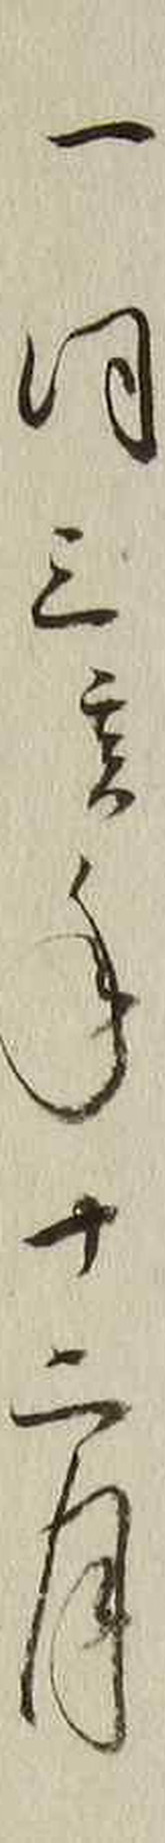一同三亥年十二月
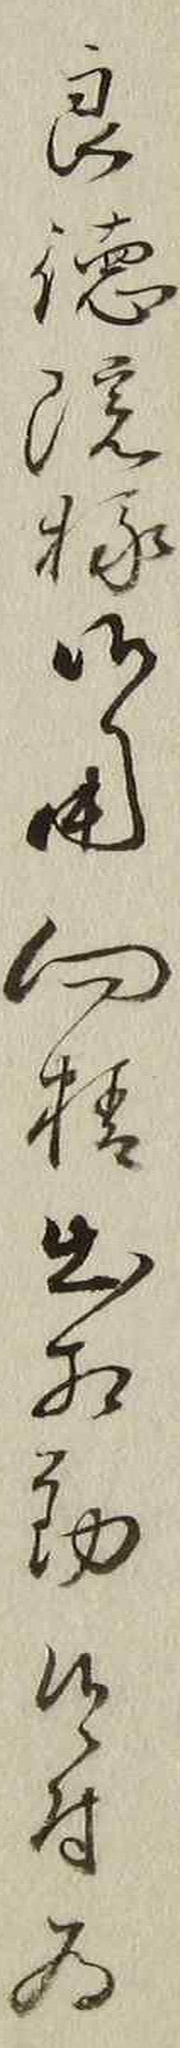良徳院様御用向精出相勤候ニ付為
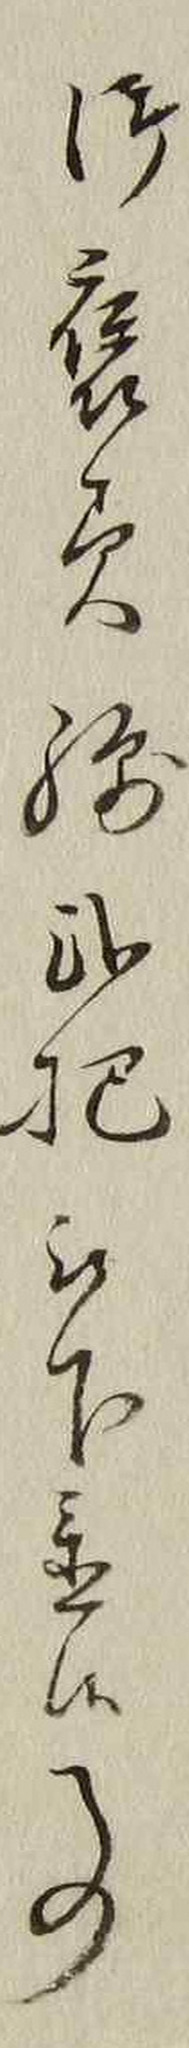御褒美綿弐把被下置候事
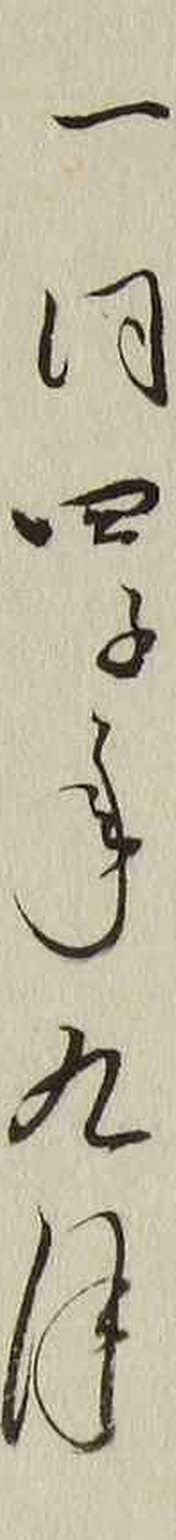一同四子年九月
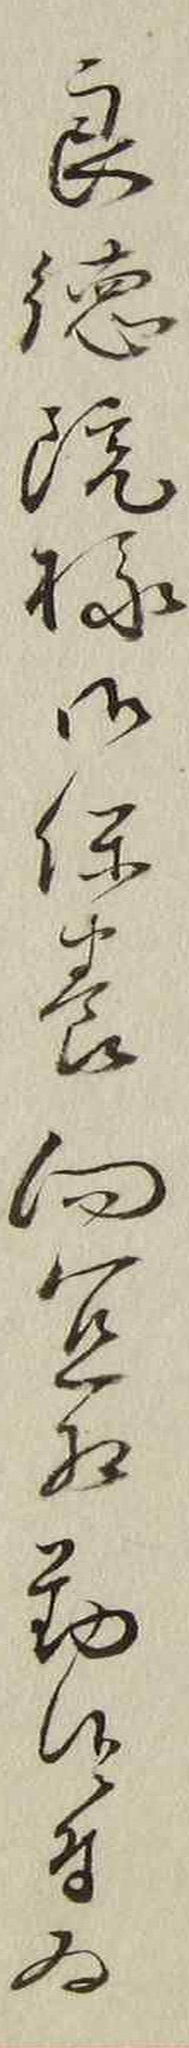良徳院様御保養向宜相勤候ニ付為
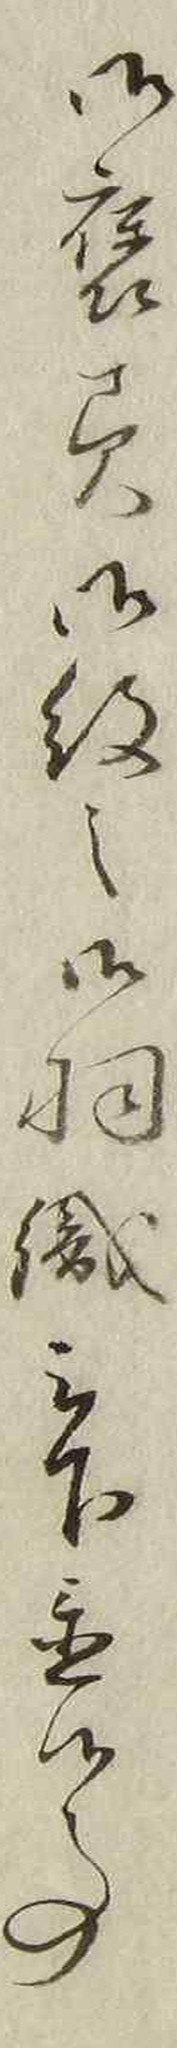御褒美御紋之御羽織被下置候事
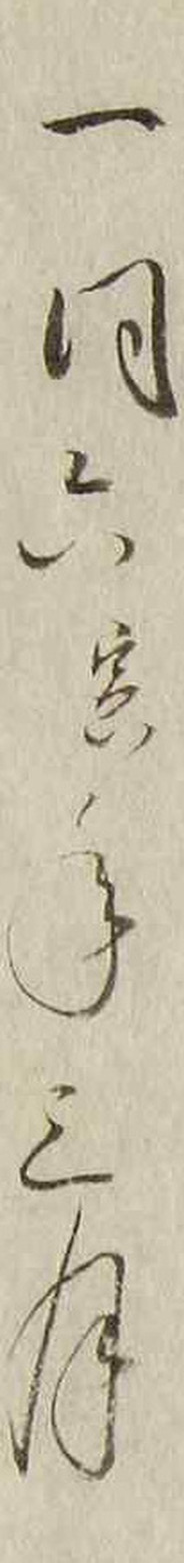一同六寅年三月

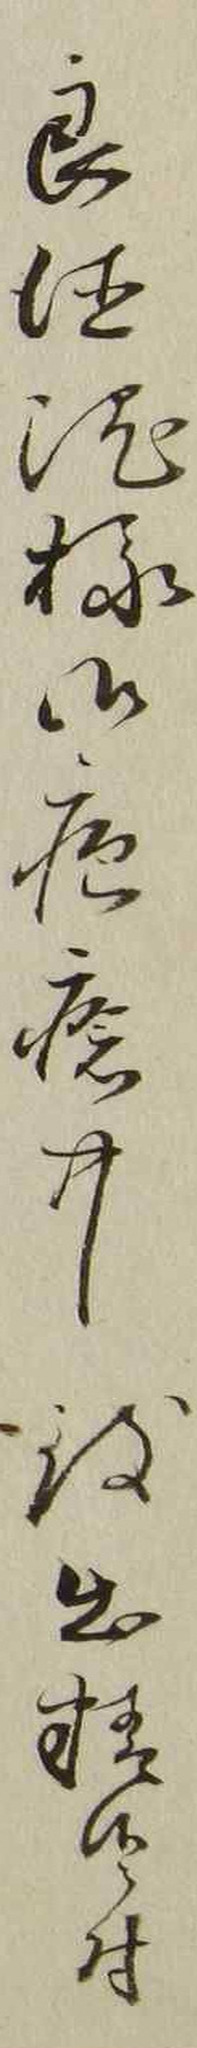良徳院様御疱瘡中致出精候ニ付
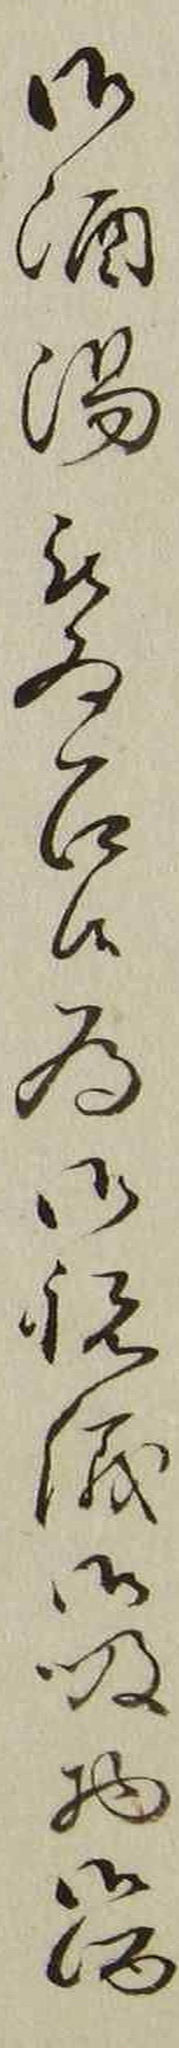御酒湯被為召候為御祝儀御吸物御酒
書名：諸士系譜　巻之8　い之部8
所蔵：会津若松市立会津図書館
